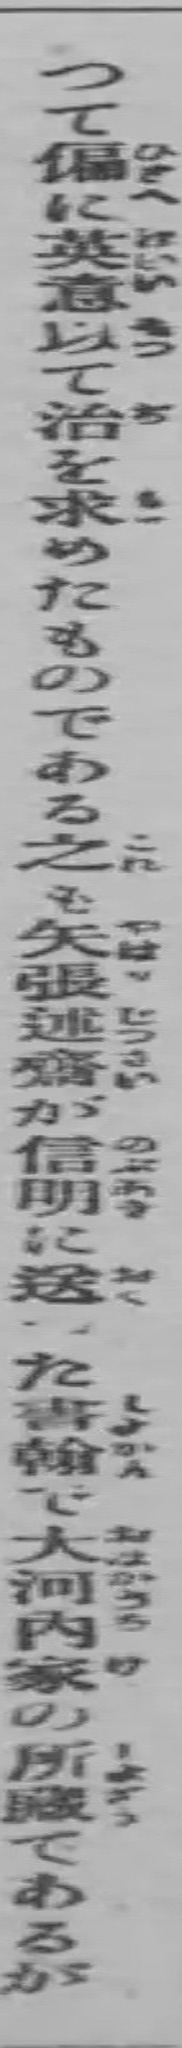つて偏に英意以て治を求めたものである之も矢張述斉が信明に送つた書翰で大河内家の所蔵であるが
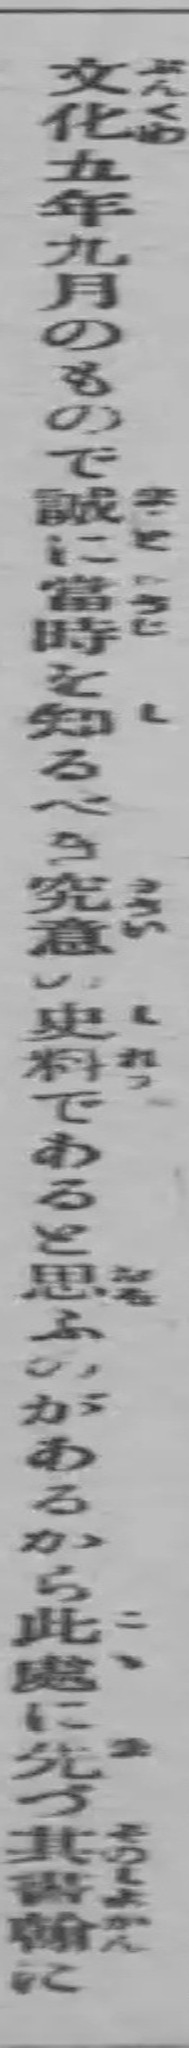文化五年九月のもので誠に当時を知るべき究意の史料であると思ふのがあるから此処に先づ其書翰に
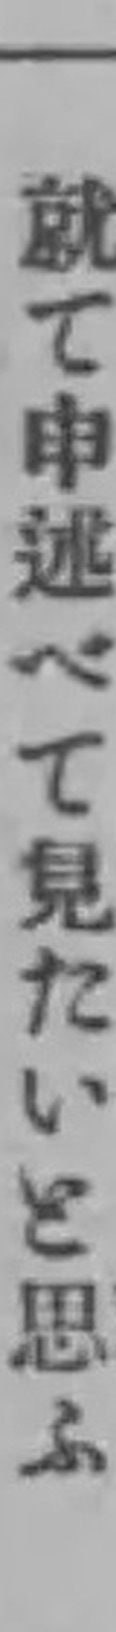就て申述べて見たいと思ふ

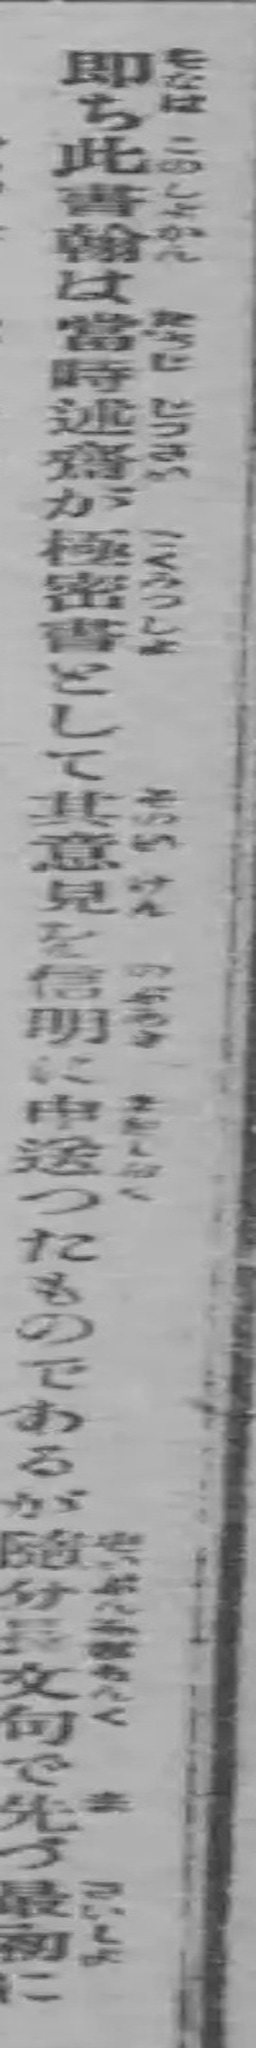即ち此書翰は当時述斉が極密書として其意見を信明に申送つたものであるが随分長文句で先づ最初に
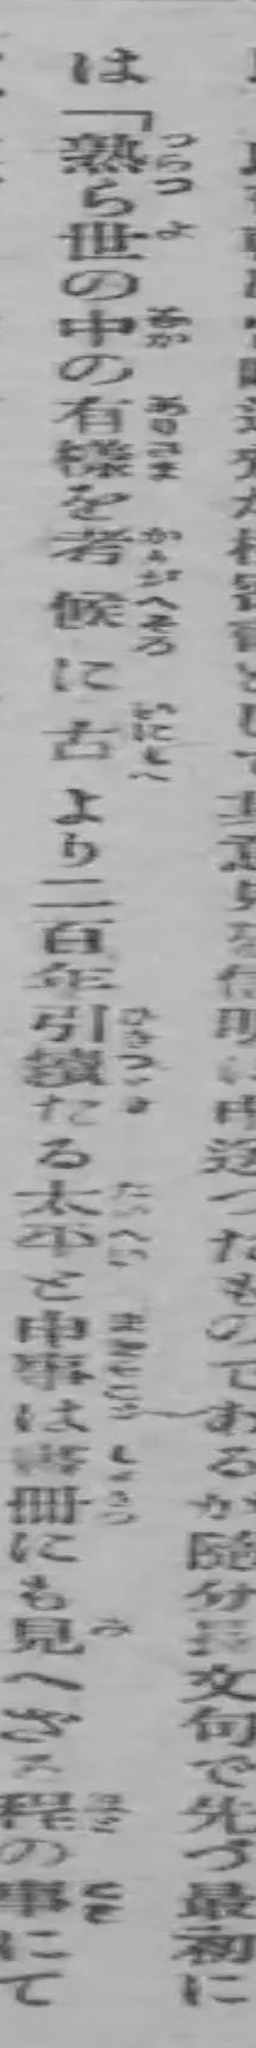は「熟ら世の中の有様を考候に古より二百年引続たる太平と申事は書冊にも見へざる程の事にて
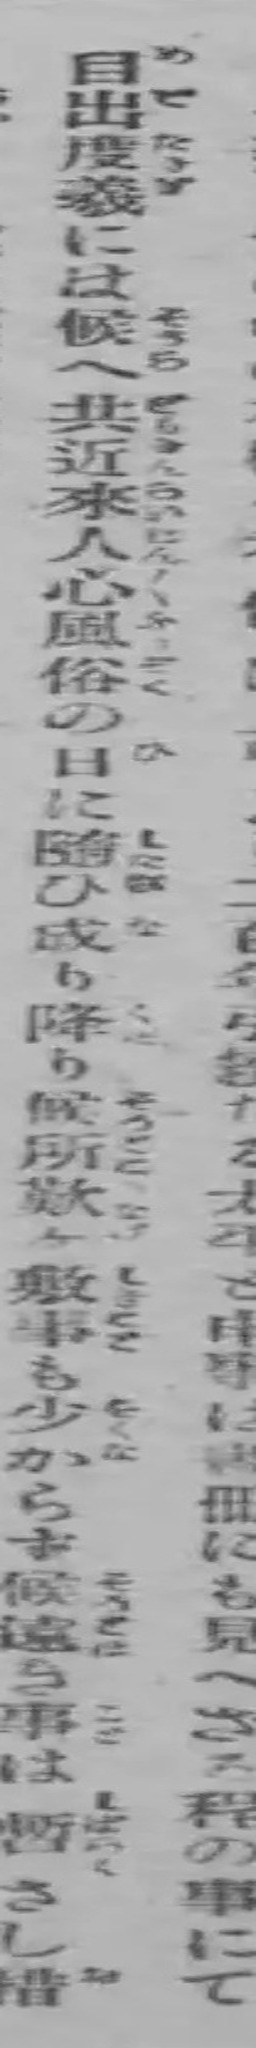目出度義には候へ共近来人心風俗の日に随ひ成り降り候所歎ケ敷事も少からず候遠き事は暫さし措
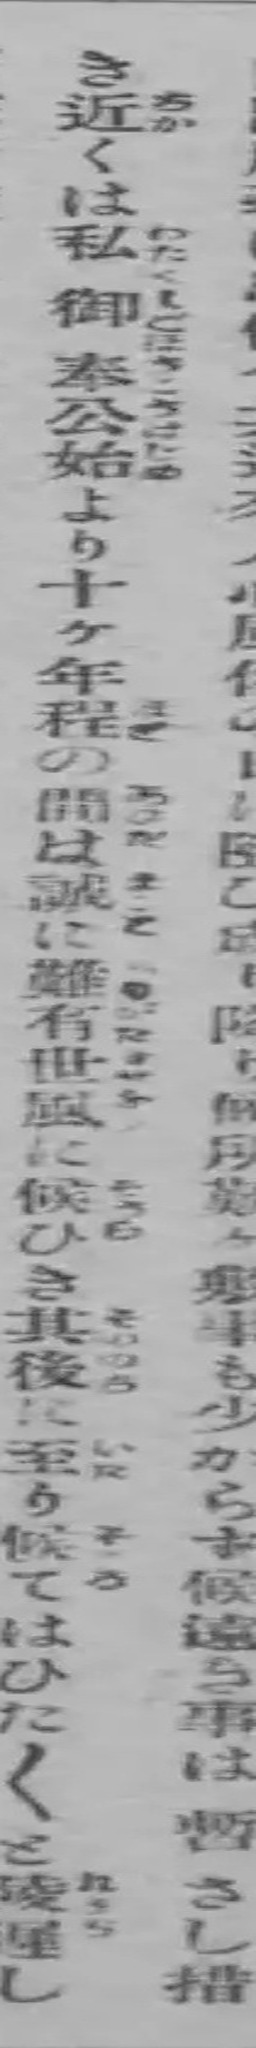き近くは私御奉公始より十ケ年程の間は誠に難有世風に候ひき其後に至り候てはひた〳〵と陵遅し
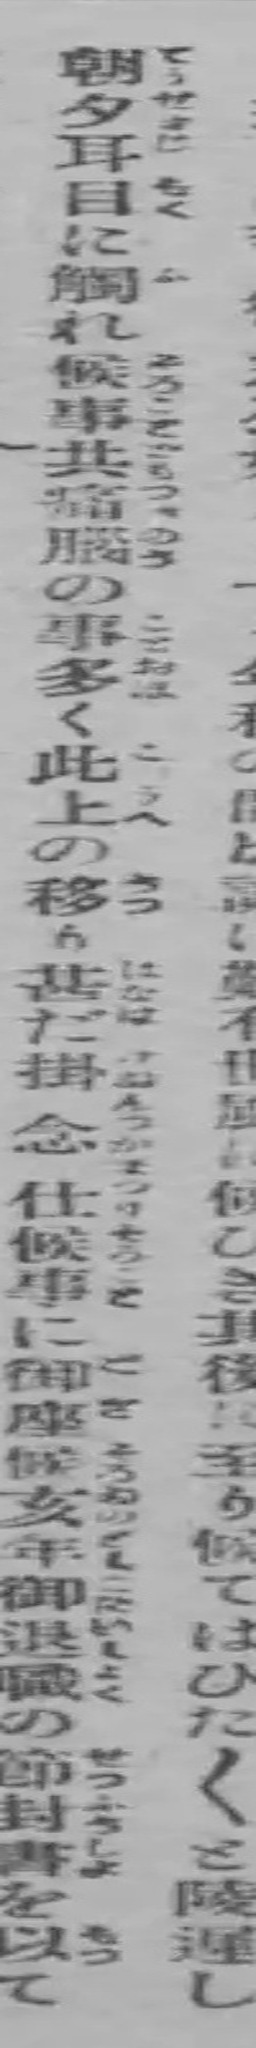朝夕耳目に觸れ候事共痛脳の事多く此上の移りは甚だ掛念仕候事に御座候亥年御退職の節封書を以て
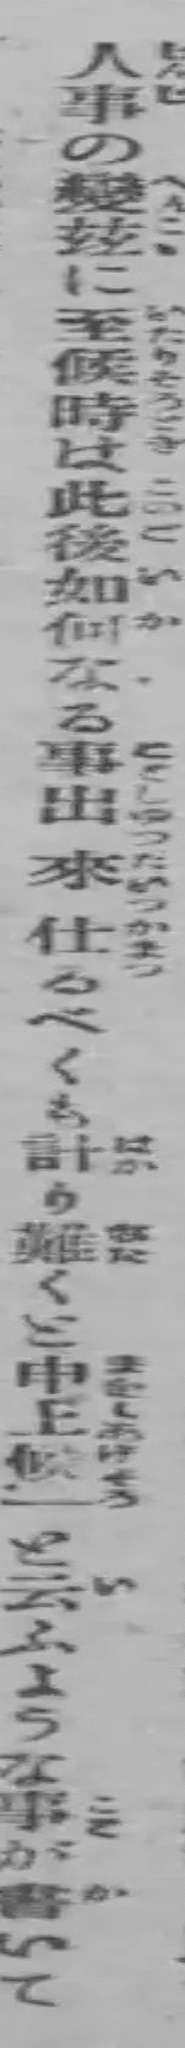人事の変茲に至候時は此後如何なる事出来仕るべくも計り難くと申上候」と云ふような事が書いて
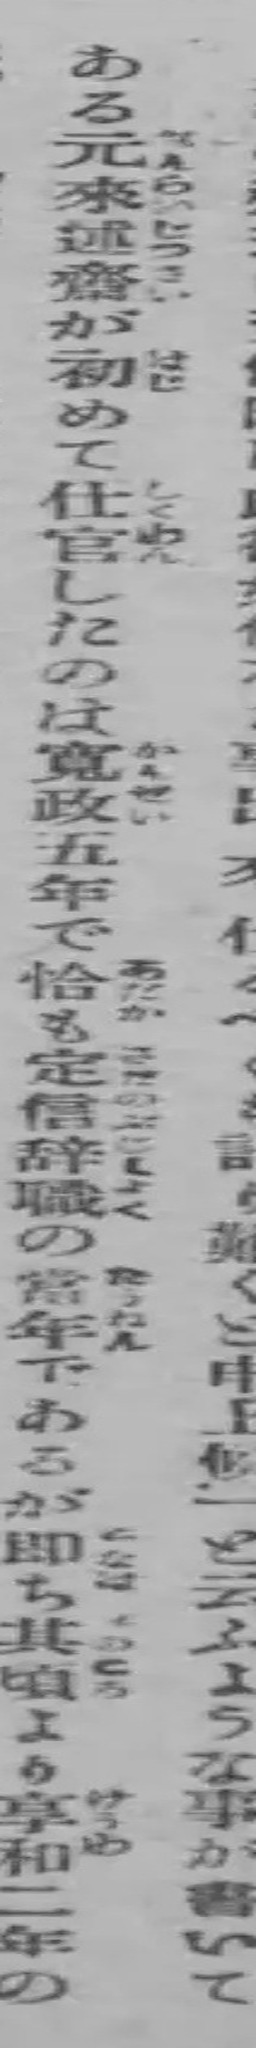ある元来述斉が初めて仕官したのは寛政五年で恰も定信辞職の当年であるが即ち其頃より享和二年の
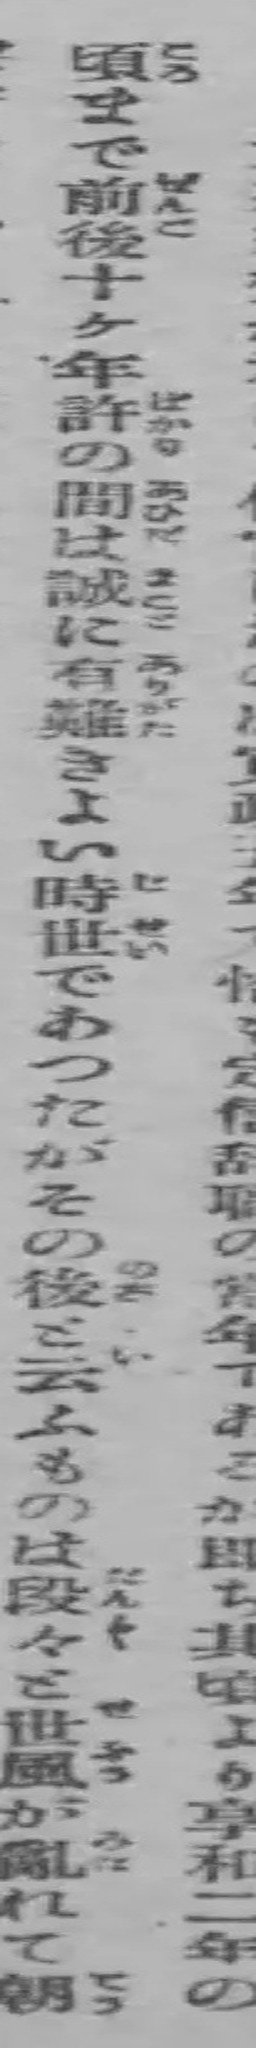頃まで前後十ケ年許の間は誠に有難きよい時世であつたがその後と云ふものは段々と世風が乱れて朝
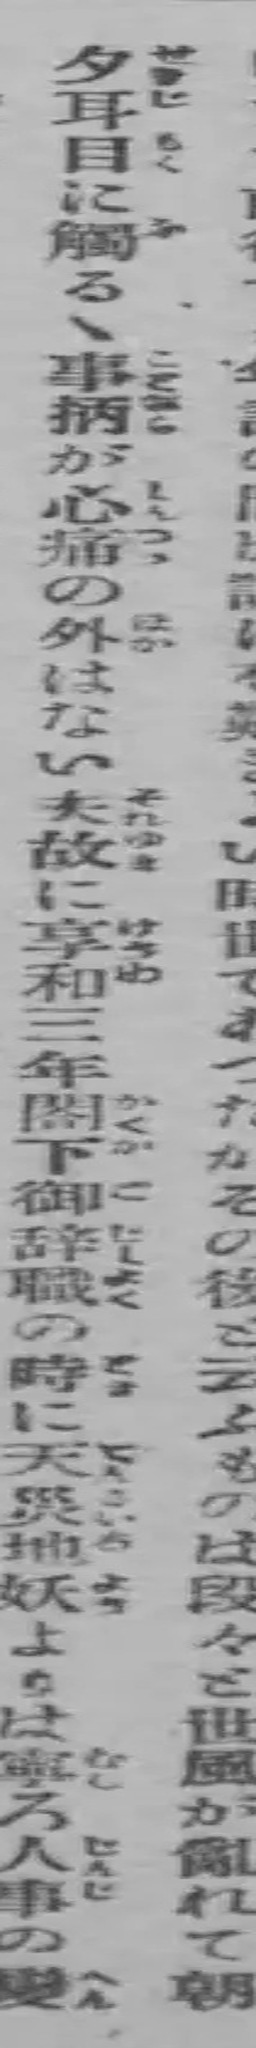夕耳目に觸るゝ事柄が心痛の外はない夫故に享和三年閣下御辞職の時に天災地妖よりは寧ろ人事の変
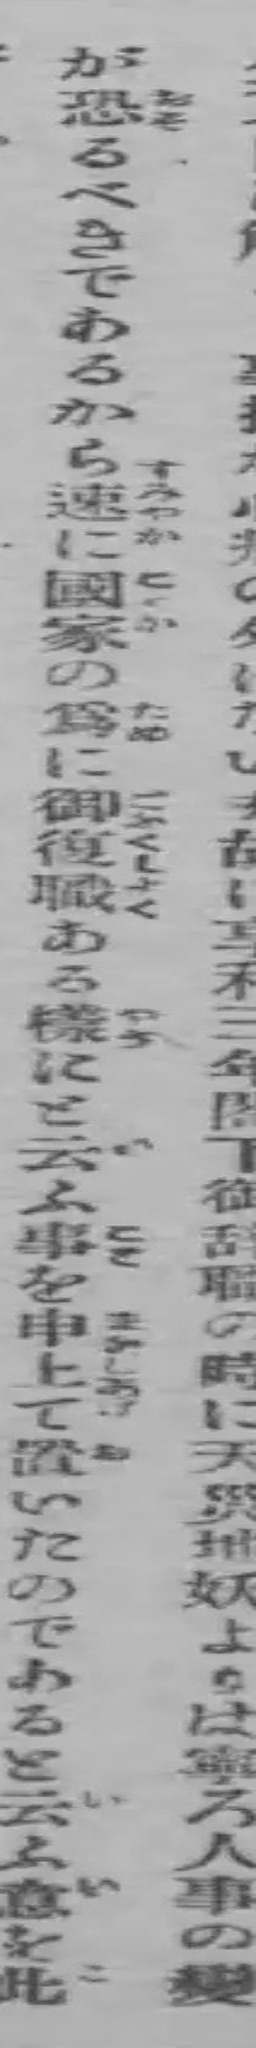が恐るべきであるから速に国家の為に御復職ある様にと云ふ事を申上て置いたのであると云ふ意を此
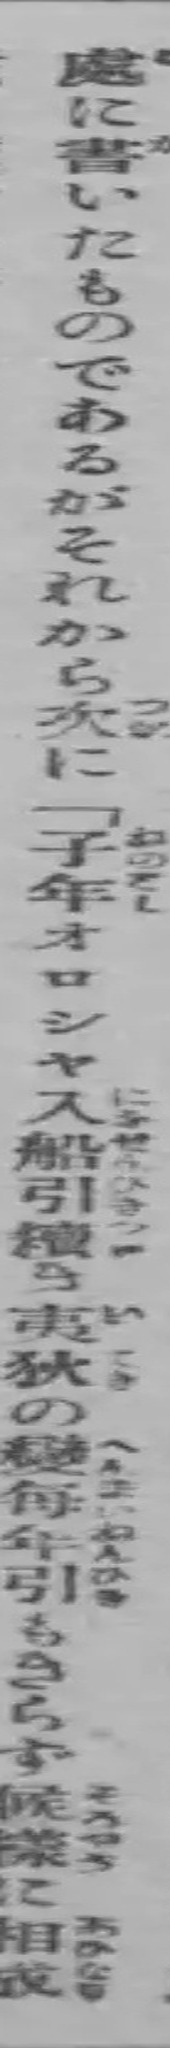処に書いたものであるがそれから次に「子年オロシヤ入船引続き夷狄の変毎年引もきらず候様に相成
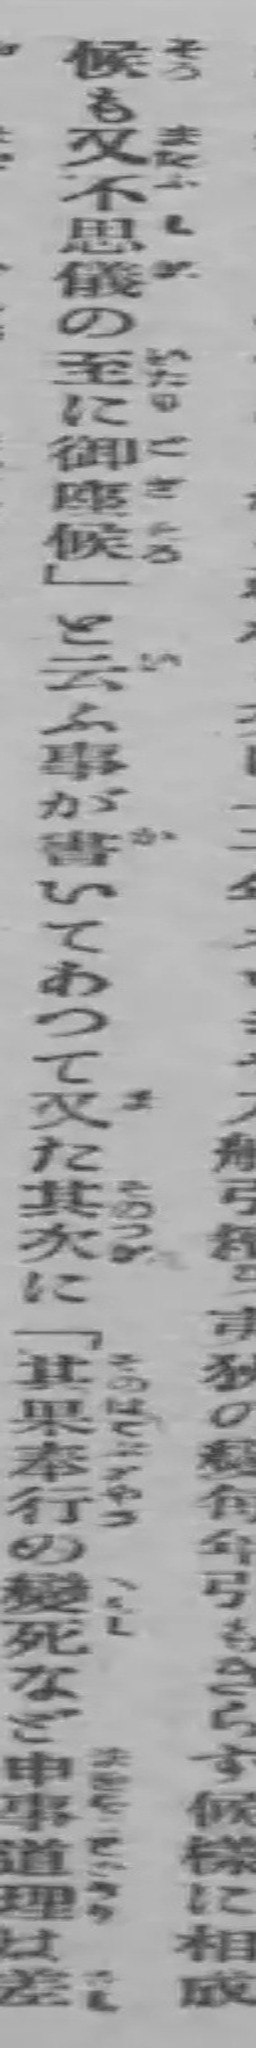候も又不思儀の至に御座候」と云ふ事が書いてあつて又た其次に「其果奉行の変死など申事道理は差
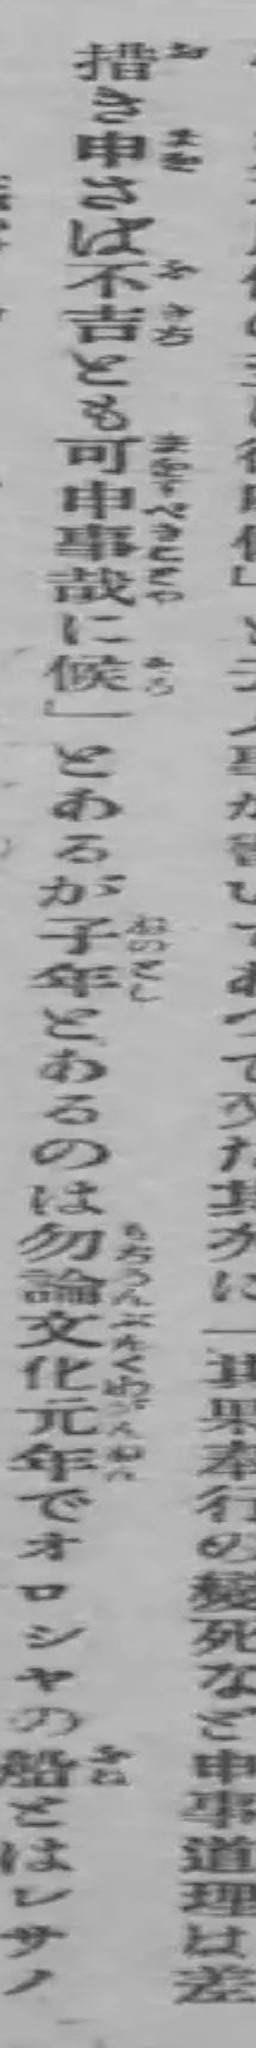措き申さば不吉とも可申事哉に候」とあるが子年とあるのは勿論文化元年でオロシヤの船とはレサノ
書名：豊橋市史談
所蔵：国立国会図書館 National Diet Library, JAPAN
